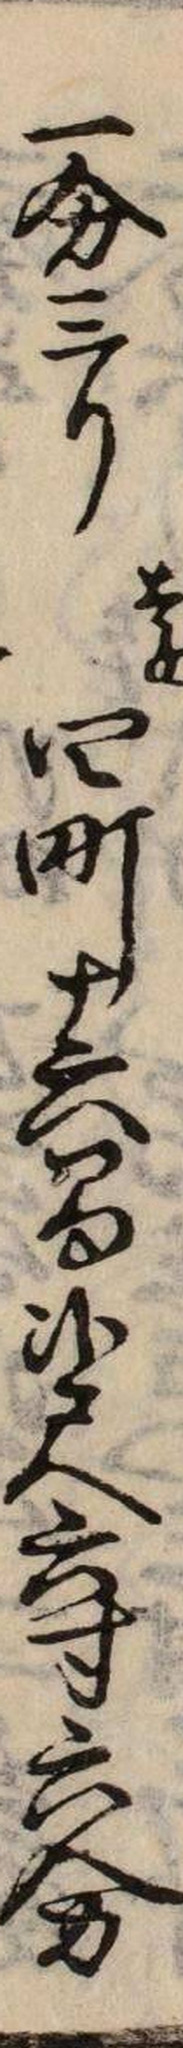一分三り遠四町十六間弐尺六寸六分
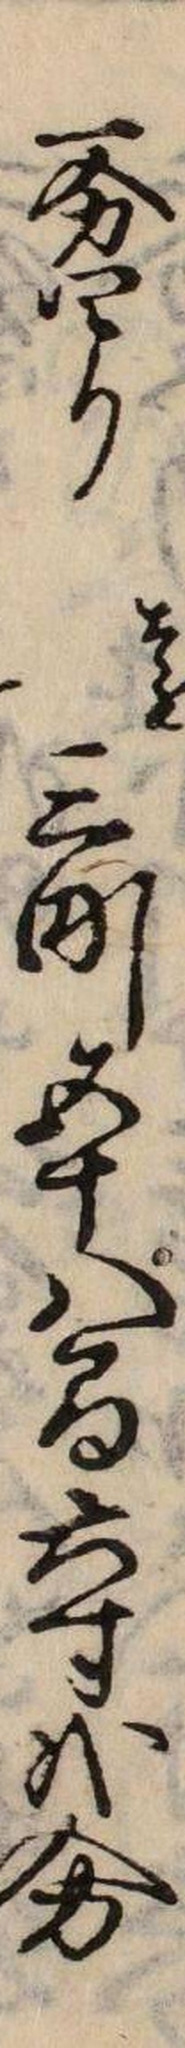一分四り遠三町五十八間六寸弐分＃
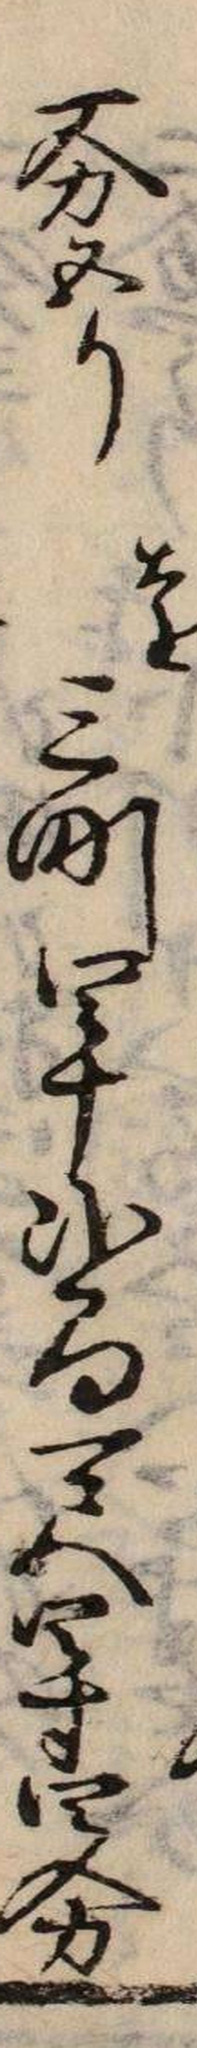一分五り遠三町四十弐間一尺四寸四分
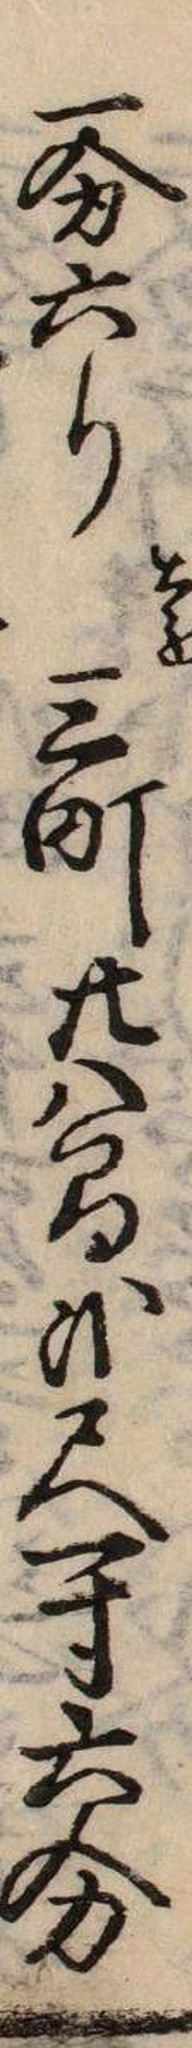一分六り遠三町廿八間弐尺一寸六分
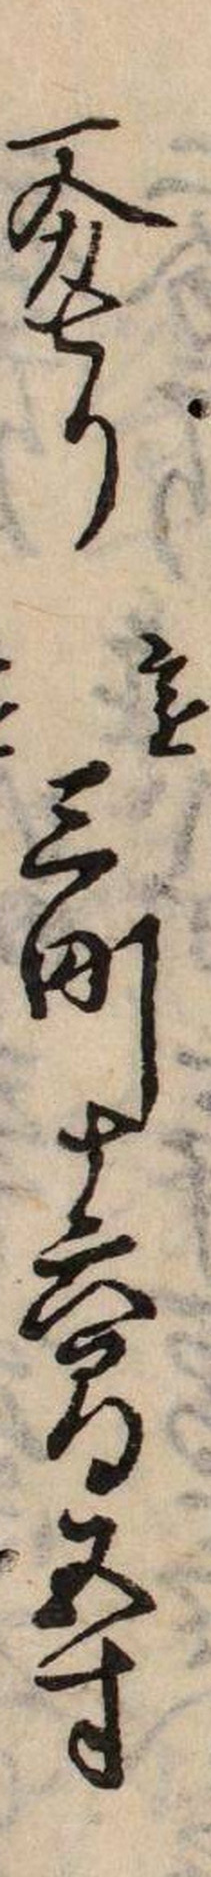一分七り遠三町十六間五寸
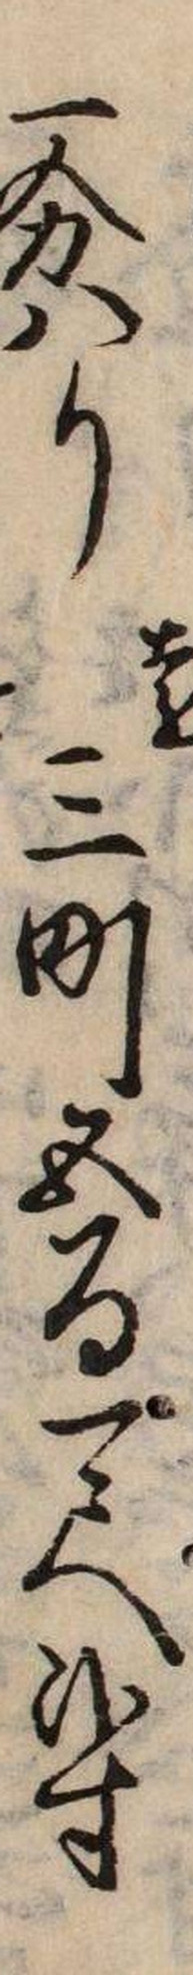一分八り遠三町五間一尺弐寸
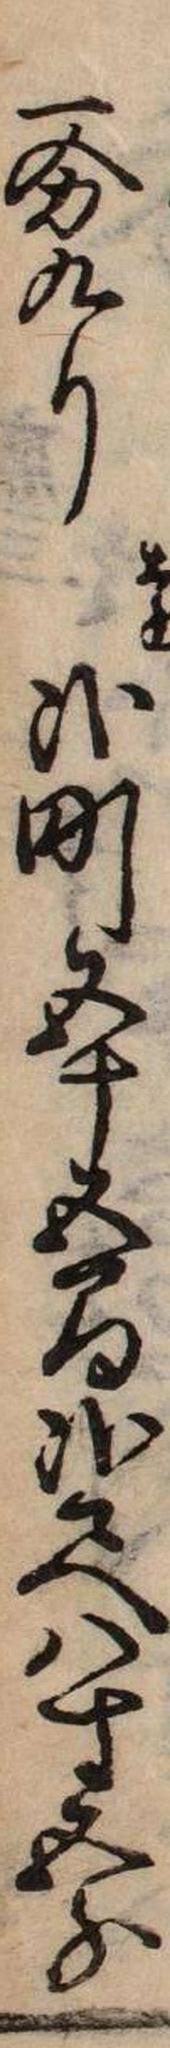一分九り遠弐町五十五間弐尺八寸五分

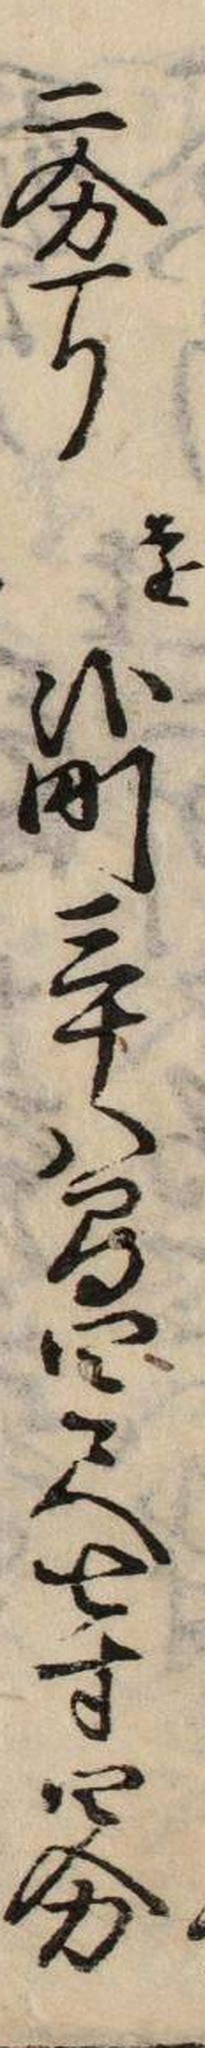二分一り遠弐町三十八間四尺七寸四分
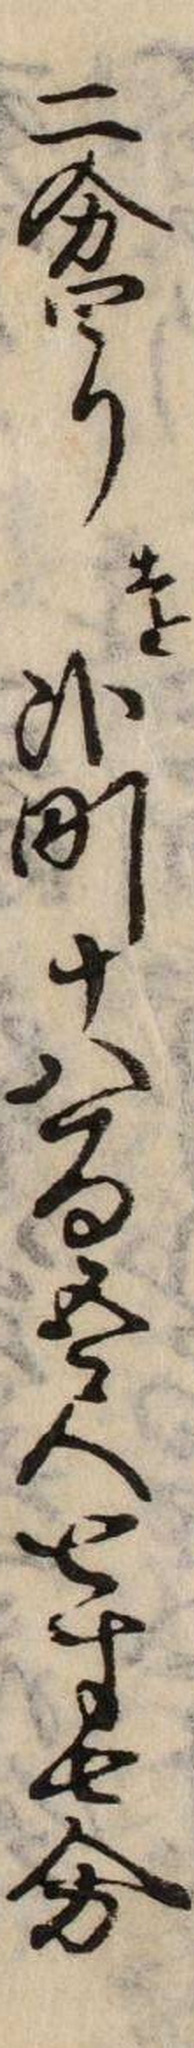二分四り遠弐町十八間五尺七寸七分
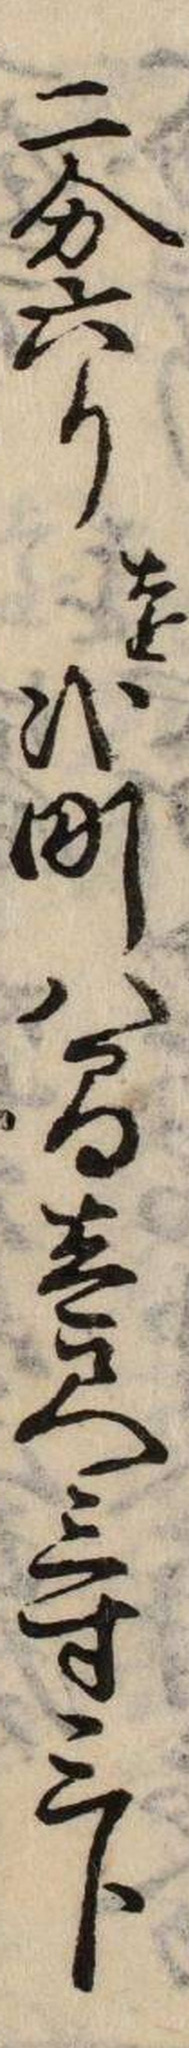二分六り遠弐町八間壱尺三寸三分
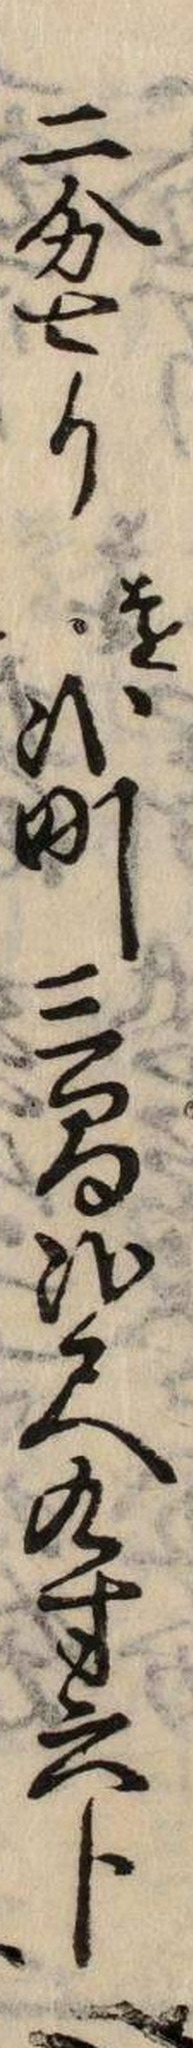二分七り遠弐町三間弐尺九寸六分
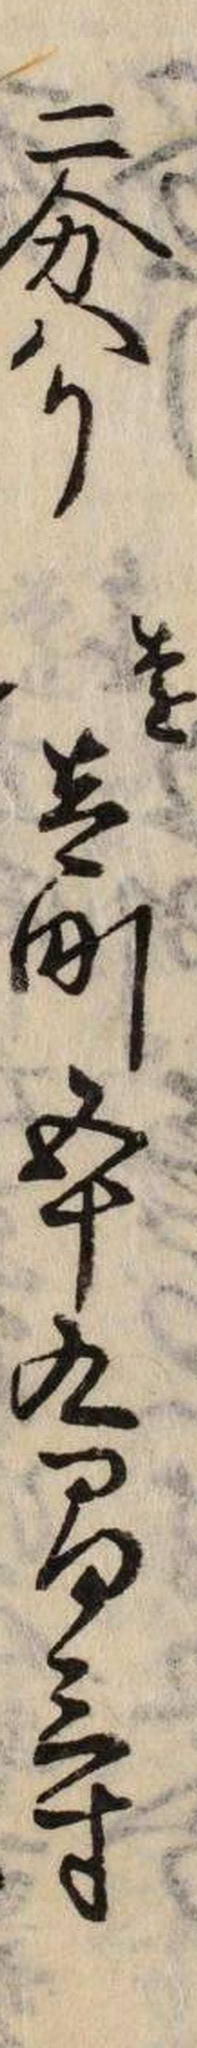二分八り遠壱町五十九間三寸
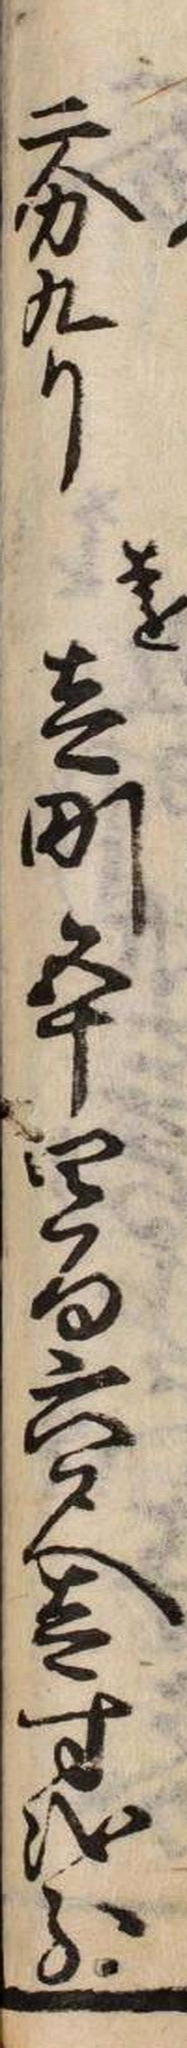二分九り遠壱町五十四間六尺壱寸弐分
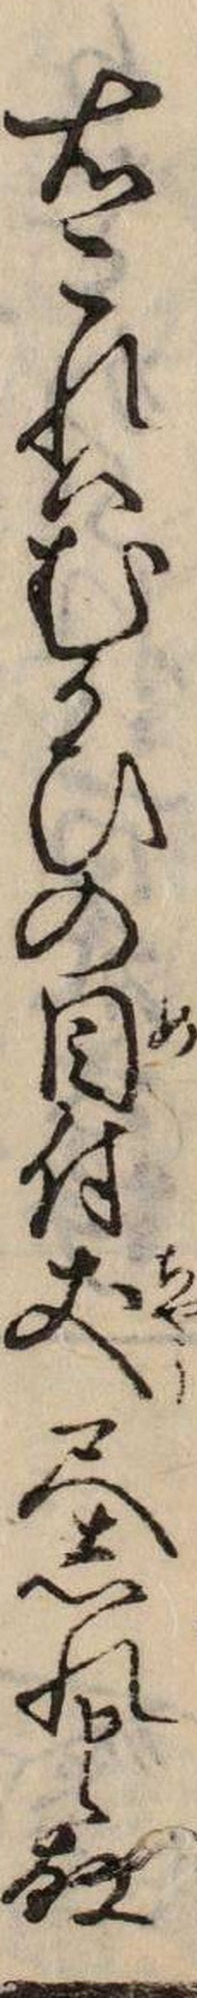右これはむかひの目付丈尺しれ申候故
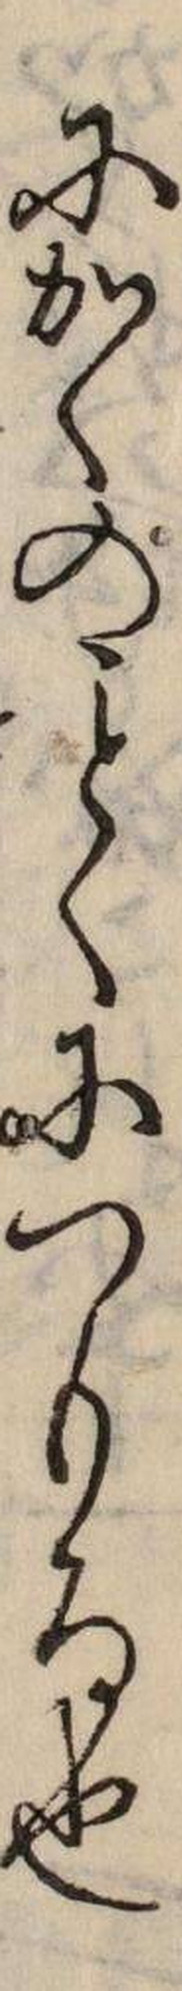にかくのことくにつもる也
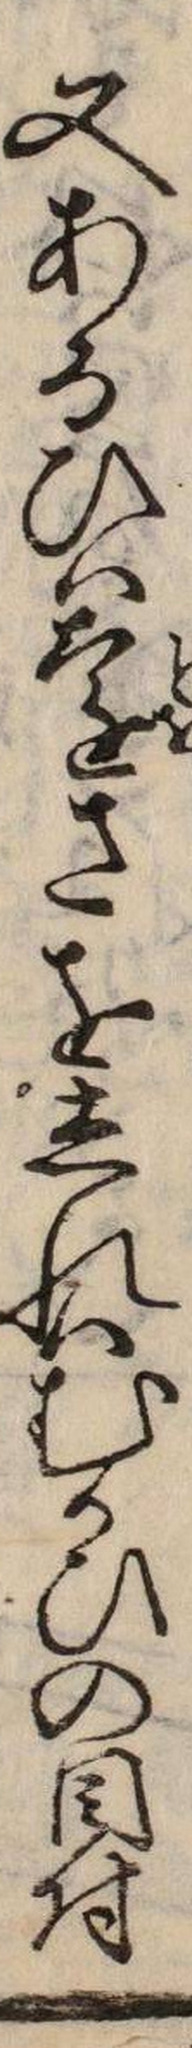又あるひは遠さをしれはむかひの目付
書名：塵劫記（寛永11年自跋、京都府立京都学・歴彩館追貴8）
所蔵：京都府立京都学・歴彩館 国文学研究資料館
